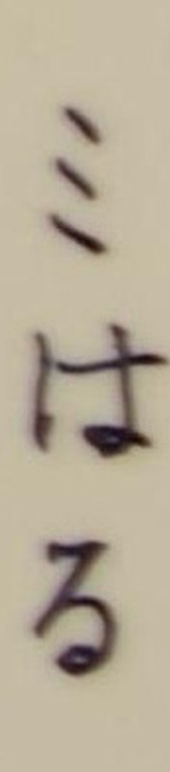ミはる
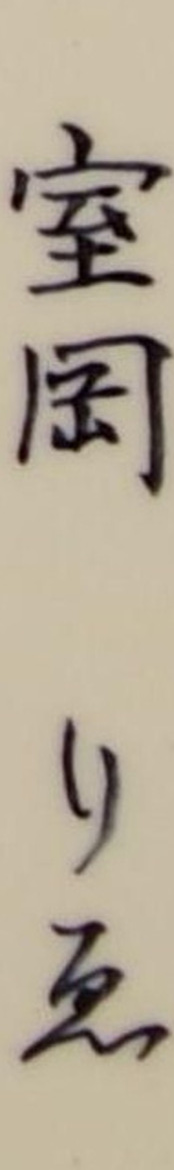室岡りゑ
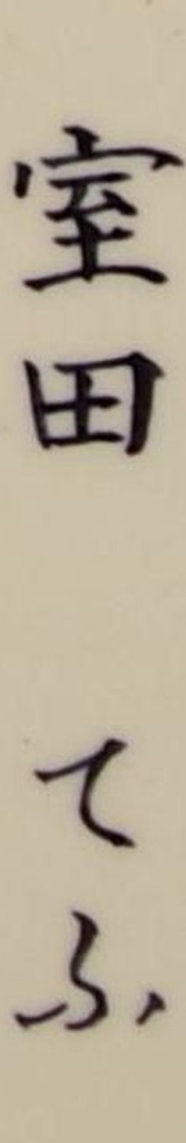室田てふ
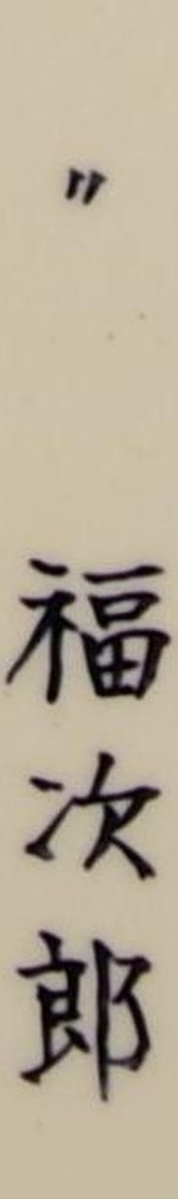福次郎
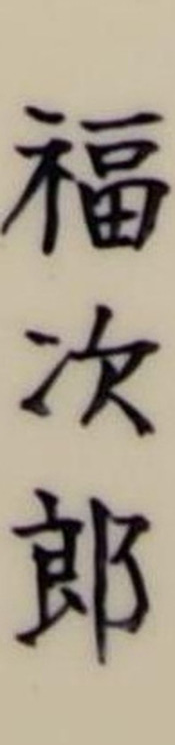福次郎
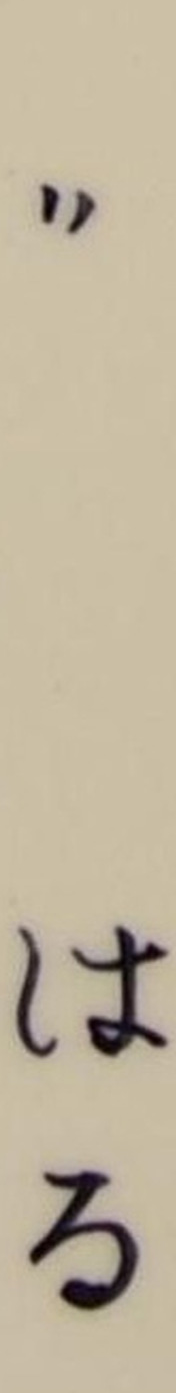ミはる
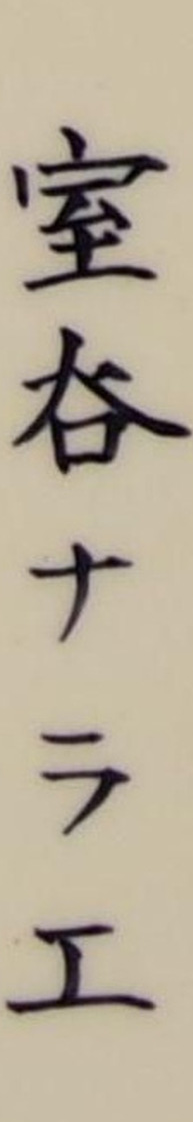室谷ナラエ
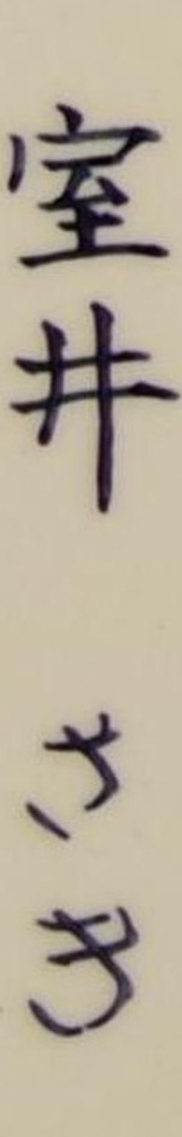室井さき
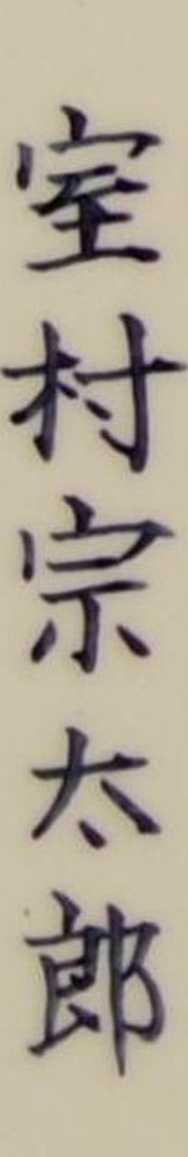室村宗太郎
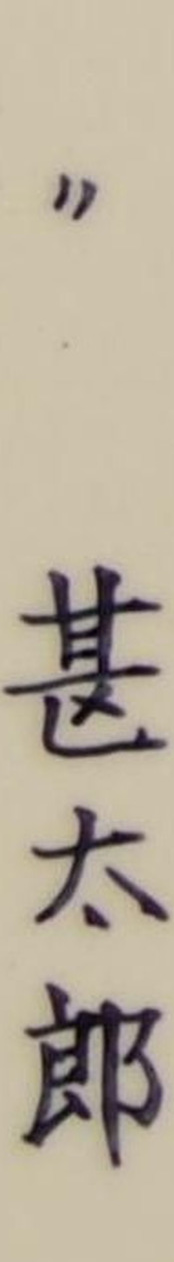甚太郎
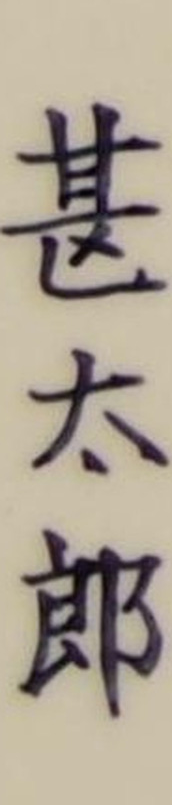甚太郎

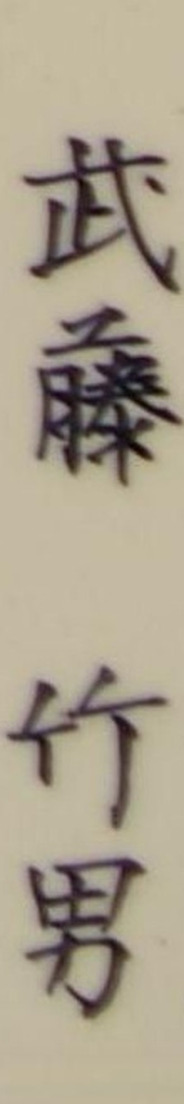武藤竹男
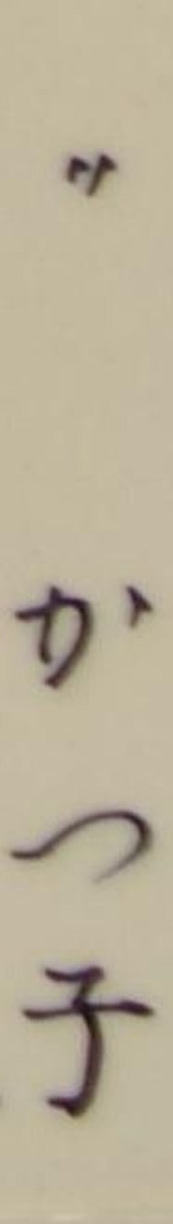かつ子
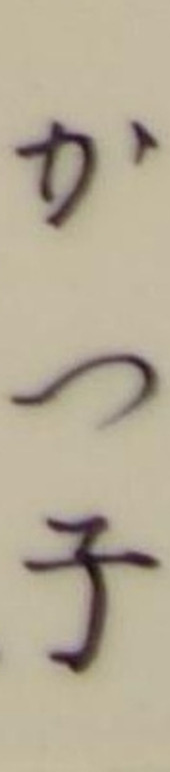かつ子
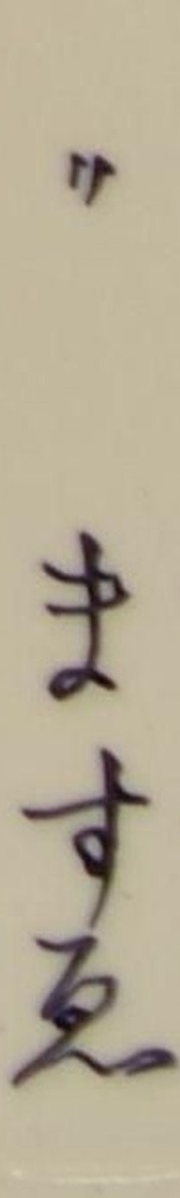ますゑ
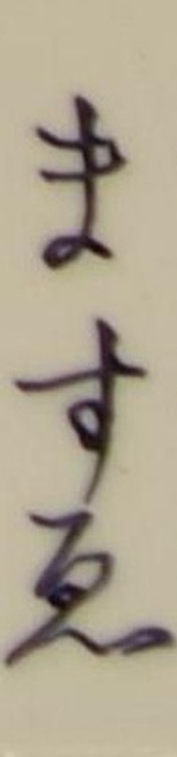ますゑ
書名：A~D
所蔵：koyasan kongobuji
